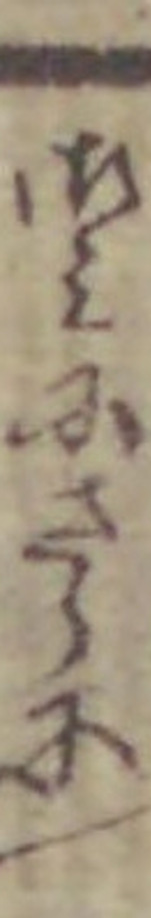御みにさらに
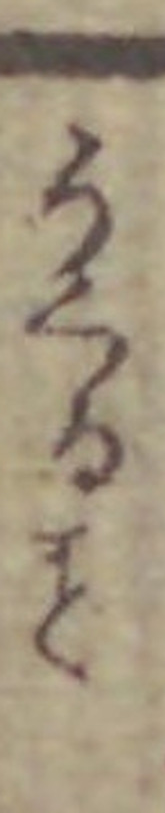うくること
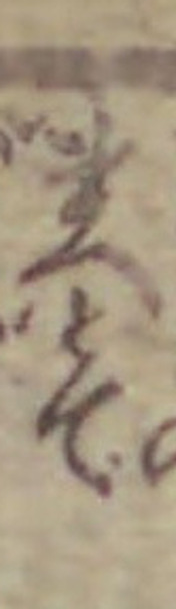まへとて
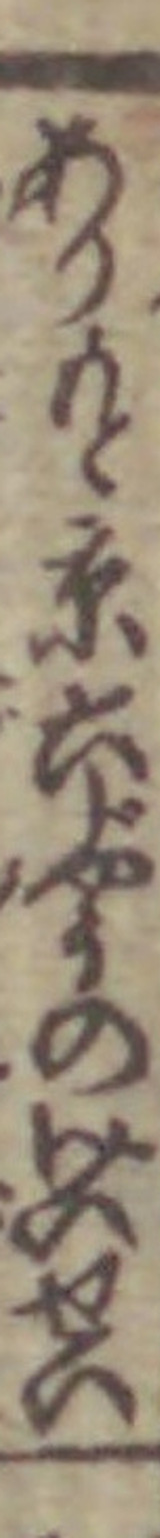ありもと京六じやうのけいせい
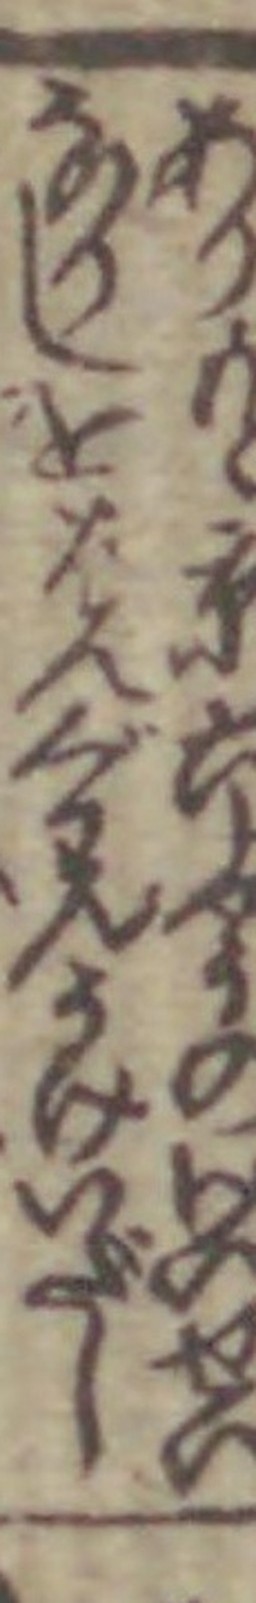なりしをはんぐわんうけいだし
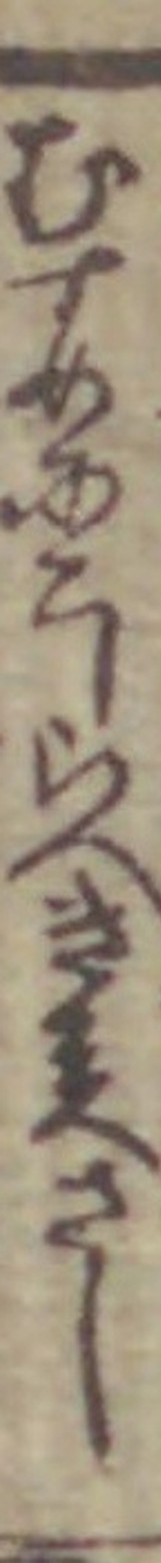むすめにこしらへきみへさし
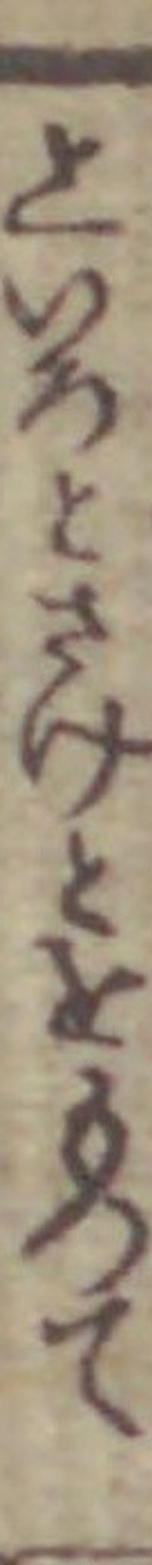上いろとさけとをもつて
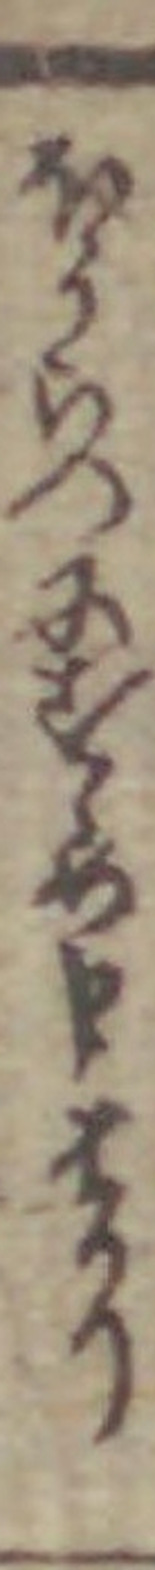ほうらつにすゝめ申はかり
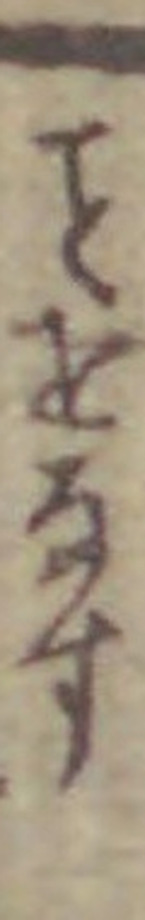ことをなす
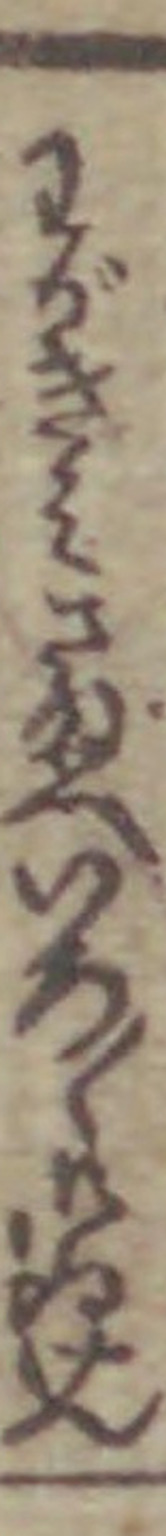わがきみさまへいろ〳〵御いけん
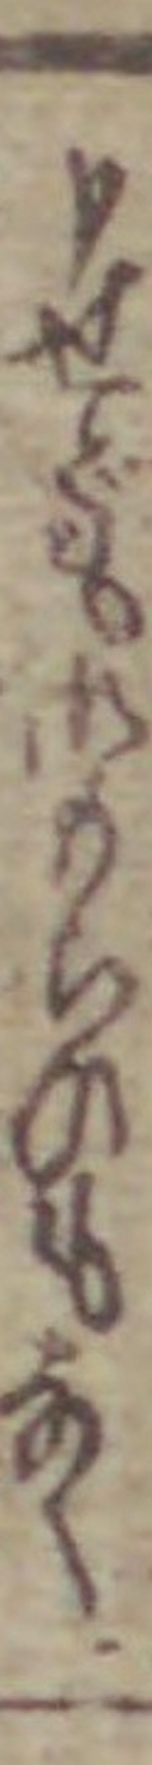申せども御もちひもなく
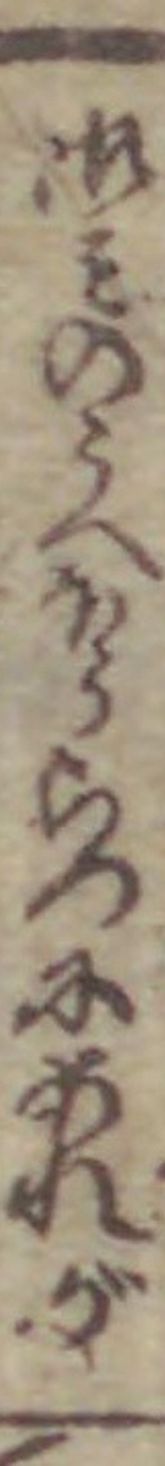御みのうへほうらつにあれが
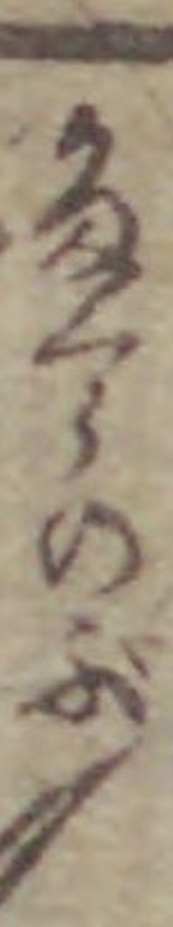かまくらのぶ
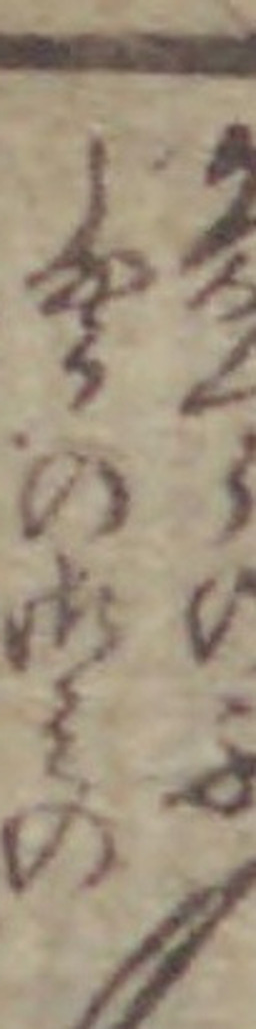しやうの御みの
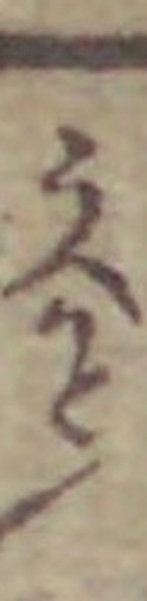うへかと
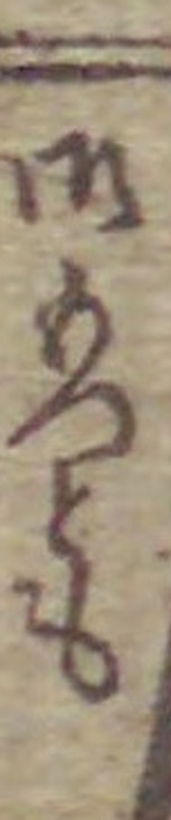御もつとも
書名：鎌倉山紅葉浮名
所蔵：国立国会図書館 National Diet Library, JAPAN
